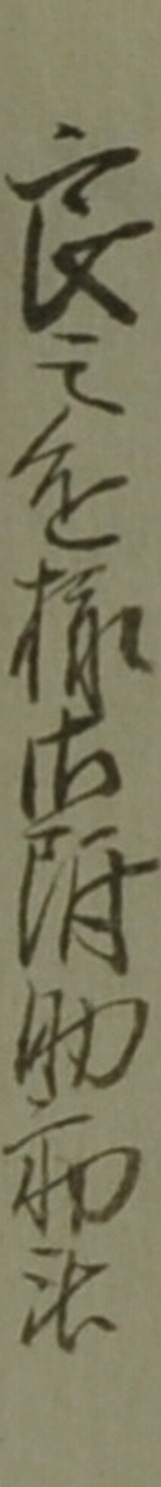良之進様御附当分助勤被
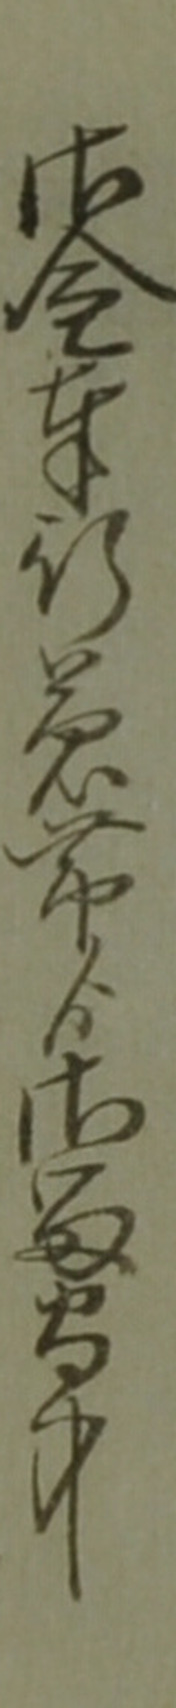御金奉行兼帯ゟ御留守中
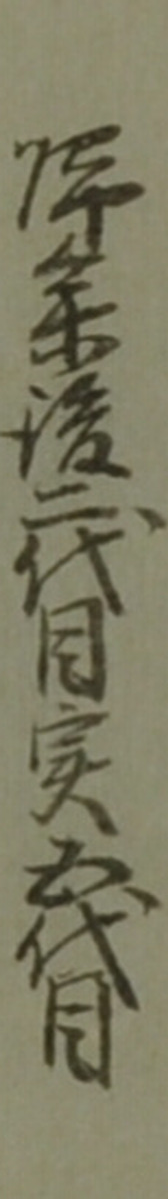帰参後二代目実五代目
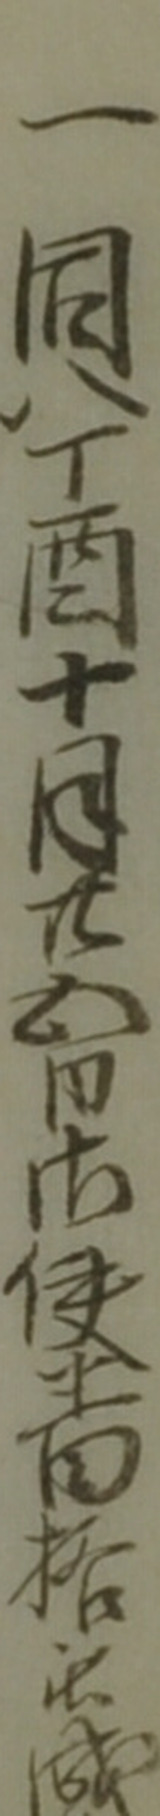一同八丁酉十月廿五日御使番格被成下
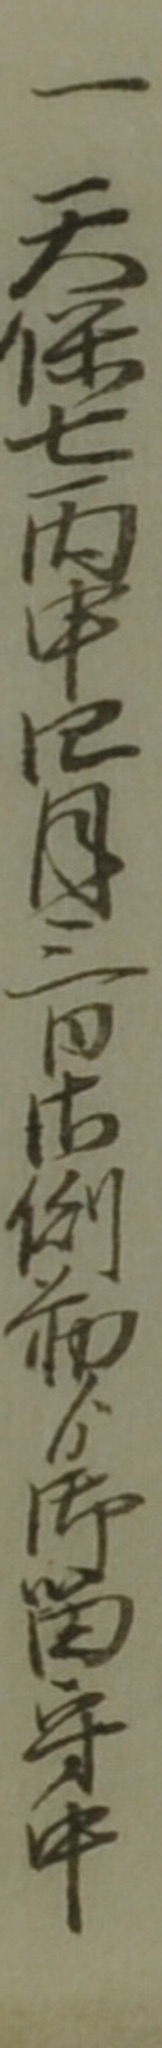一天保七丙申四月三日御側勤ゟ御留守中
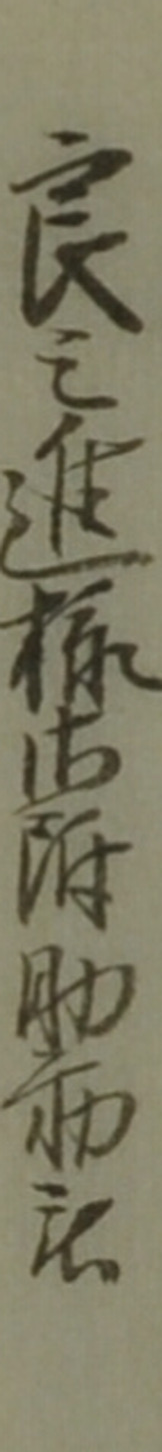良之進様御附当分助勤被
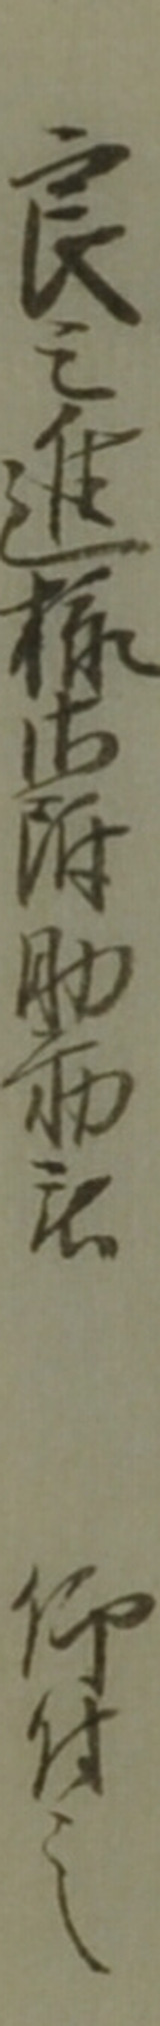良之進様御附助勤被仰付之
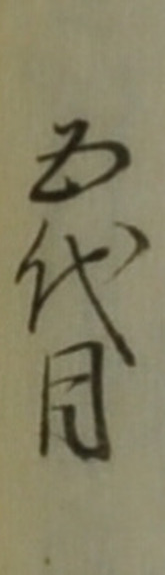五代目
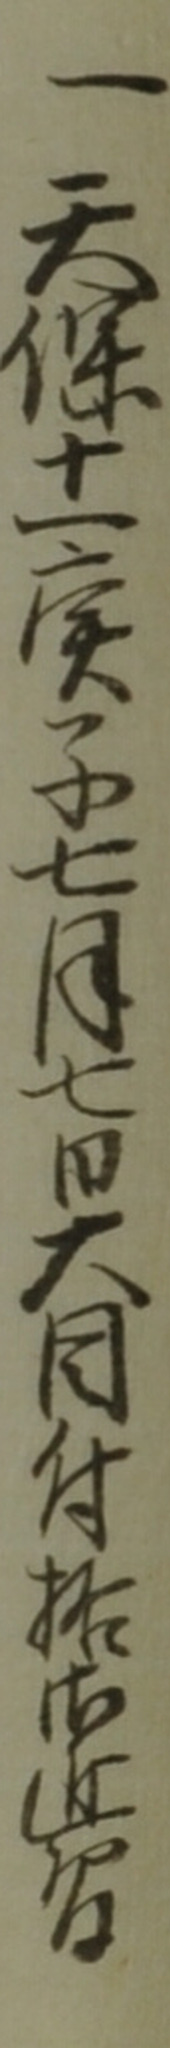一天保十一庚子七月七日大目付格御近習
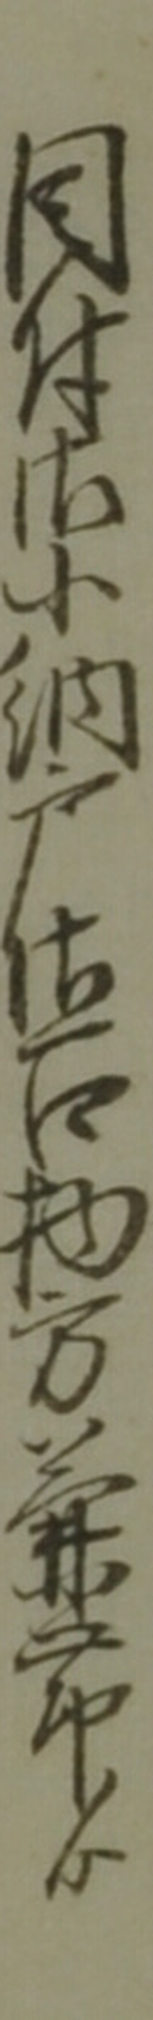目付御小納戸御召物方兼帯ゟ
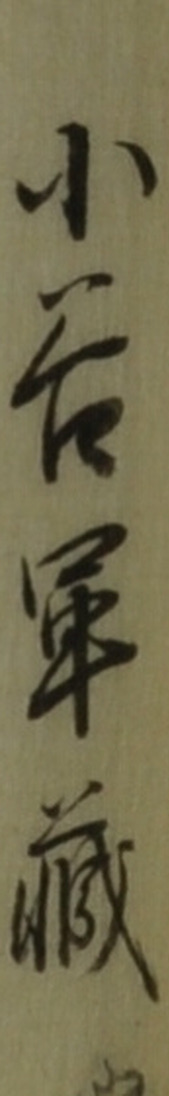小谷軍蔵
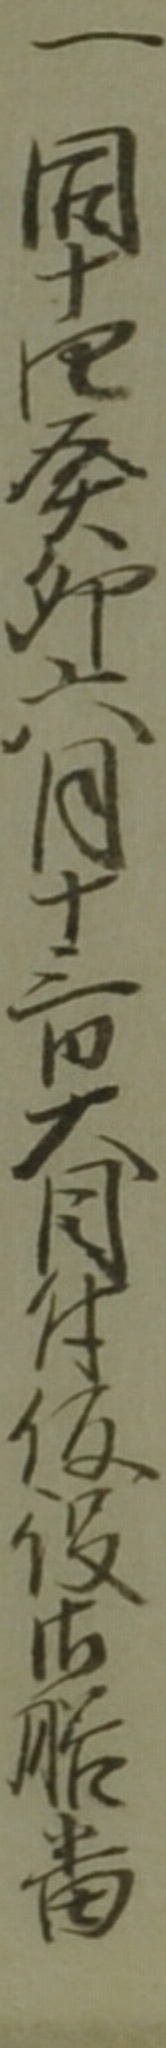一同十四癸卯六月十三日大目付仮役御膳番
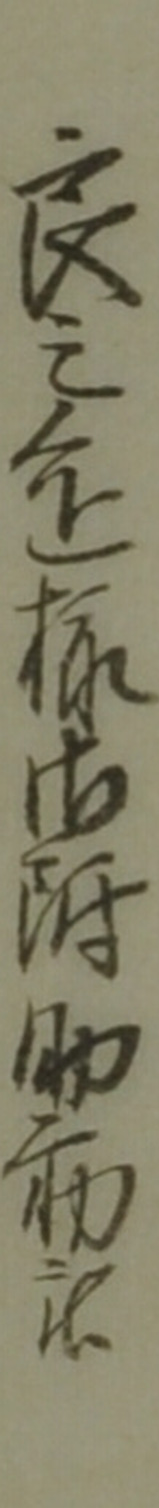良之進様御附当分助勤被
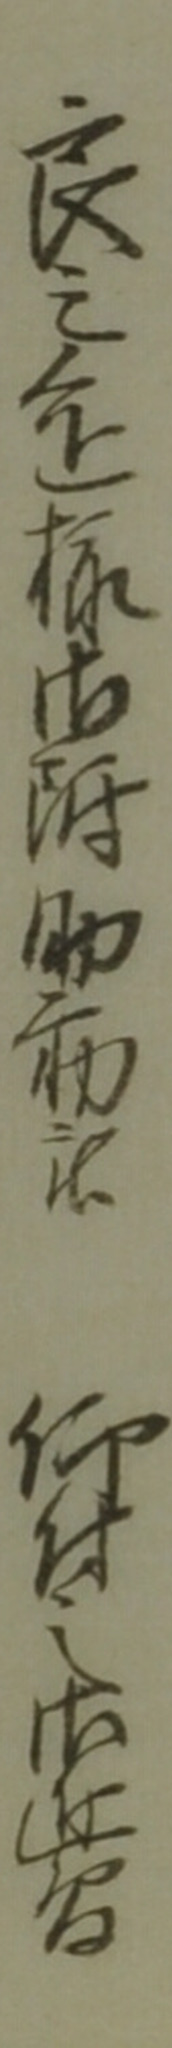良之進様御附助勤被仰付之御近習
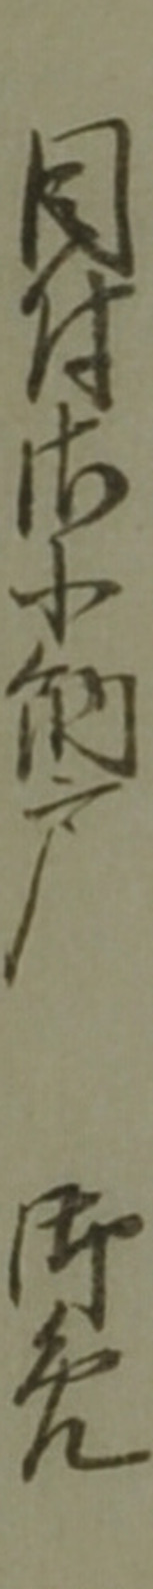目付御小納戸御免
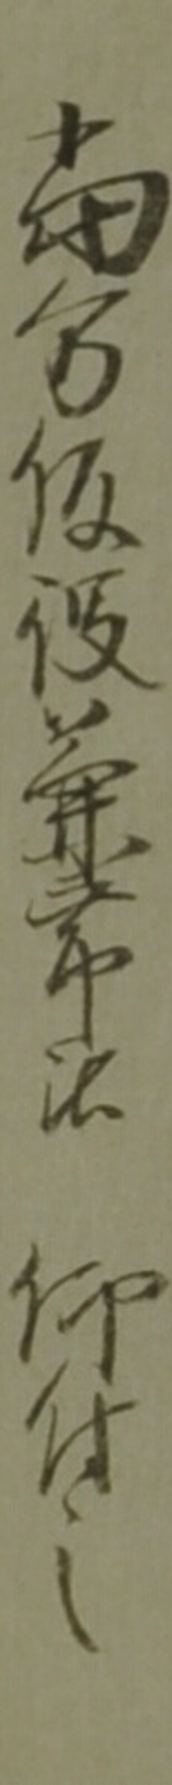当分仮役兼帯被仰付之
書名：諸御役代々録（六）
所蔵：伊那市立高遠町図書館・合同会社AMANE
